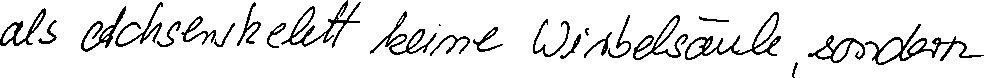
als Achsenskelett keine Wirbelsäule, sondern
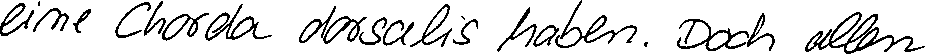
eine Chorda dorsalis haben. Doch allen
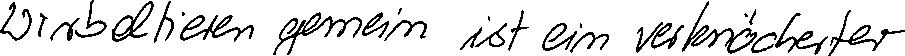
Wirbeltieren gemein ist ein verknöcherter
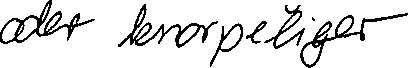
Oder knorpeliger
